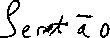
Sertão
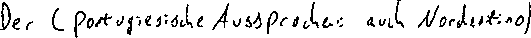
Der (portugiesische Aussprache: auch Nordestino)
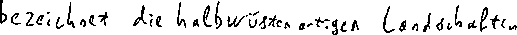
bezeichnet die halbwüstenartigen Landschaften
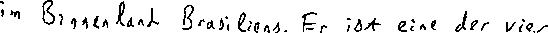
im Binnenland Brasiliens. Er ist eine der vier
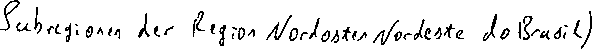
Subregionen der Region Nordosten Nordeste do Brasil)
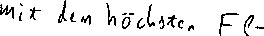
mit dem höchsten Fl-
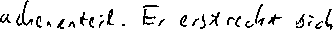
achenanteil. Er erstreckt sich
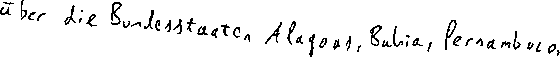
über die Bundesstaaten Alagoas, Bahia, Pernambuco,
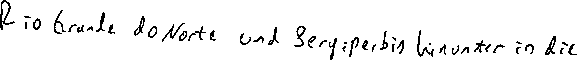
Rio Grande do Norte und Sergipe, bis hinunter in die
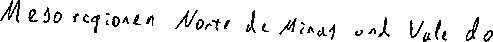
Mesoregionen Norte de Minas und Vale do
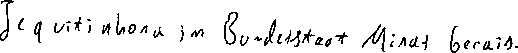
Jequitinhonha im Bundesstaat Minas Gerais.
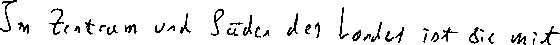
Im Zentrum und Süden des Landes ist sie mit
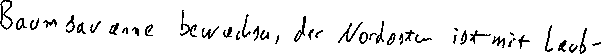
Baumsavanne bewachsen, der Nordosten ist mit Lau-
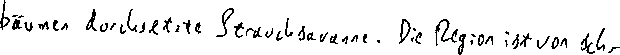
bäumen durchsetzte Strauchsavanne. Die Region ist von sehr
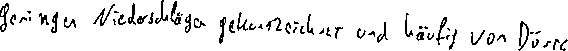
geringen Niederschlägen gekennzeichnet und häufig von Dürre
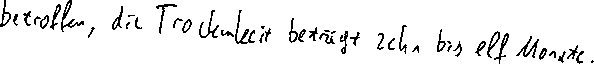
betroffen, die Trockenzeit beträgt zehn bis elf Monate.
